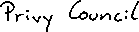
Privy Council
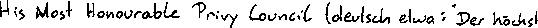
His Most Honourable Privy Council (deutsch etwa: "Der höchst
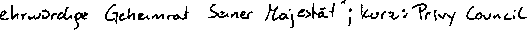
ehrwürdige Geheimrat Seiner Majestät"; kurz: Privy Council
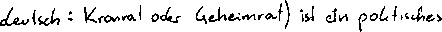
deutsch: Kronrat oder Geheimrat) ist ein politisches
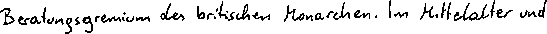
Beratungsgremium des britischen Monarchen. Im Mittelalter und
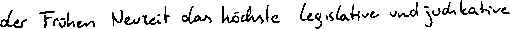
der Frühen Neuzeit das höchste legislative und judikative
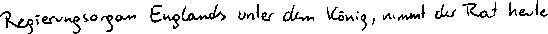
Regierungsorgan Englands unter dem König, nimmt der Rat heute
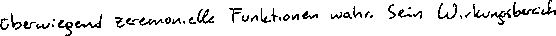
überwiegend zeremonielle Funktionen wahr. Sein Wirkungsbereich
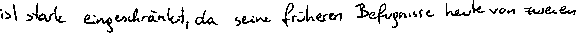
ist stark eingeschränkt, da seine früheren Befugnisse heute von zweien
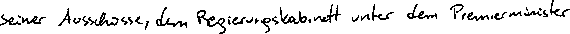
seiner Ausschüsse, dem Regierungskabinett unter dem
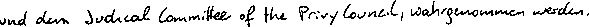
und dem Judicial Committee of the Privy Council, wahrgenommen werden.
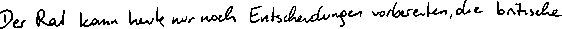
Der Rat kann heute nur noch Entscheidungen vorbereiten, die britische
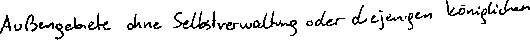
Außengebiete ohne Selbstverwaltung oder diejenigen königlichen
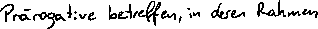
Prärogative betreffen, in deren Rahmen
